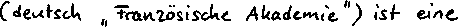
(deutsch "Französische Akademie") ist eine
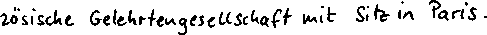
zösische Gelehrtengesellschaft mit Sitz in Paris.
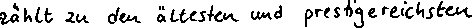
zählt zu den ältesten und prestigereichsten
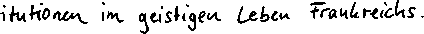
itutionen im geistigen Leben Frankreichs.
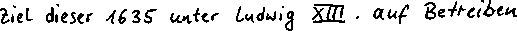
Ziel dieser 1635 unter Ludwig XIII. auf Betreiben
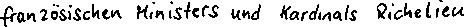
französischen Ministers und Kardinals Richelieu
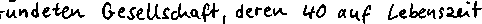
ündeten Gesellschaft, deren 40 auf Lebenszeit
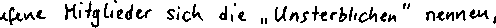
ufene Mitglieder sich die "Unsterblichen" nennen,
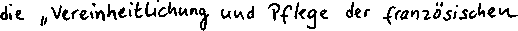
die "Vereinheitlichung und Pflege der französischen
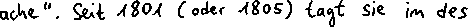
ache". Seit 1801 (oder 1805) tagt sie im des
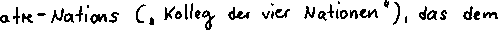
atre-Nations ("Kolleg der vier Nationen"), das dem
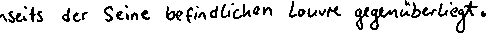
seits der Seine befindlichen Louvre gegenüberliegt.
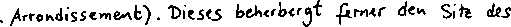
Arrondissement). Dieses beherbergt ferner den Sitz des
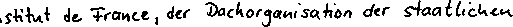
stitut de France, der Dachorganisation der staatlichen
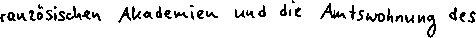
anzösischen Akademien und die Amtswohnung des
